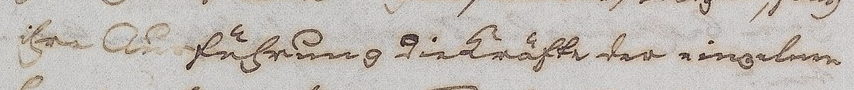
ihre Ausführung die Kräfte der einzelnen
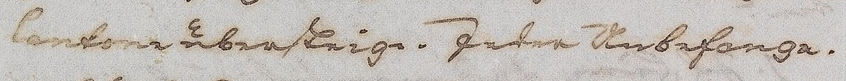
Cantone übersteige. Jeder Unbefange-
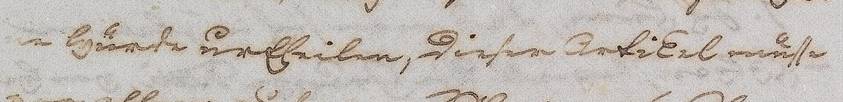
ne würde urtheilen, dieser Artikel müsse
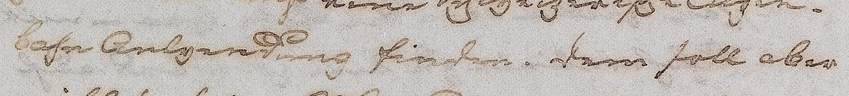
bahn Anwendung finden. Dem soll aber
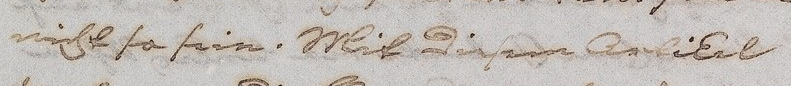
nicht so sein. Mit diesem Artikel
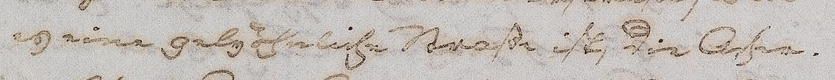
es eine gewöhnliche Straße ist, die Acher-
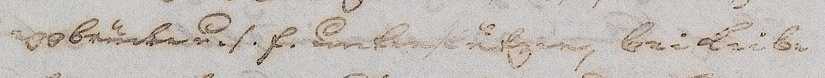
eggbrücke u. s. f. unterstützen, bei Leibe
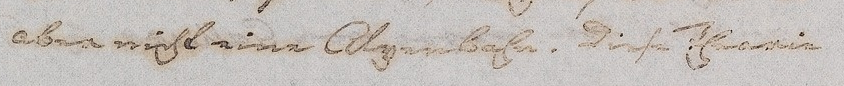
aber nicht eine Alpenbahn. Diese Theorie
